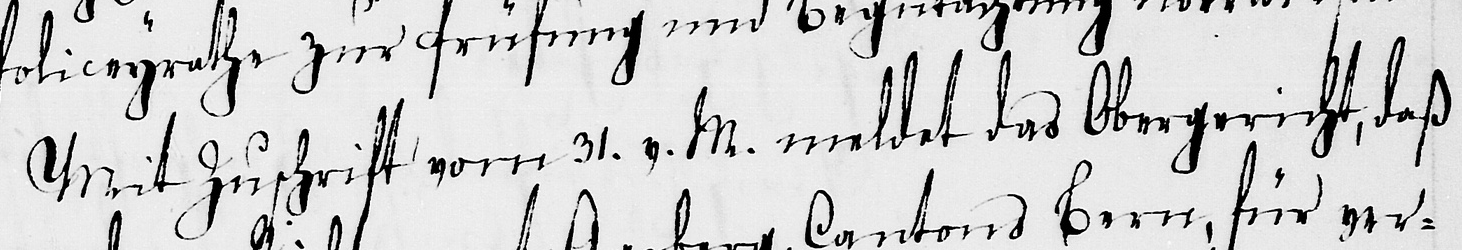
Mit Zuschrift vom 31. v. M. meldet das Obergericht, daß
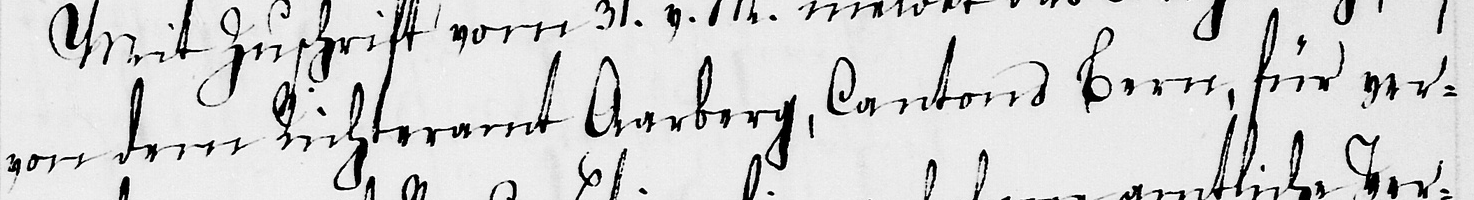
von dem Richteramt Aarberg, Cantons Bern, für vers¬
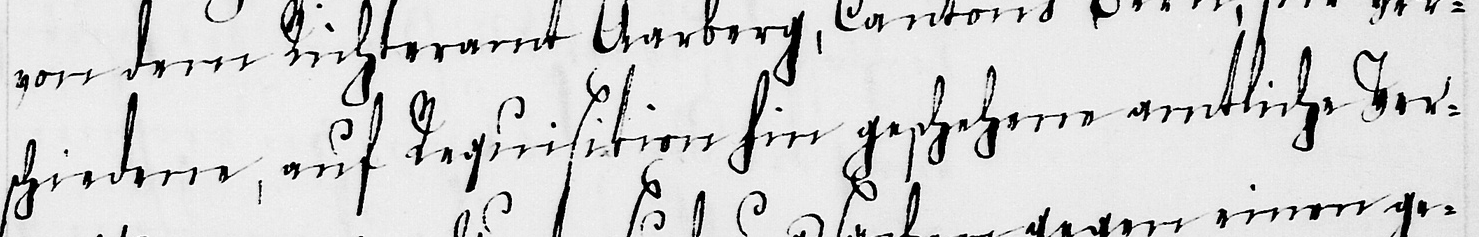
chiedene, auf Requisition hin geschehene amtliche Ver¬
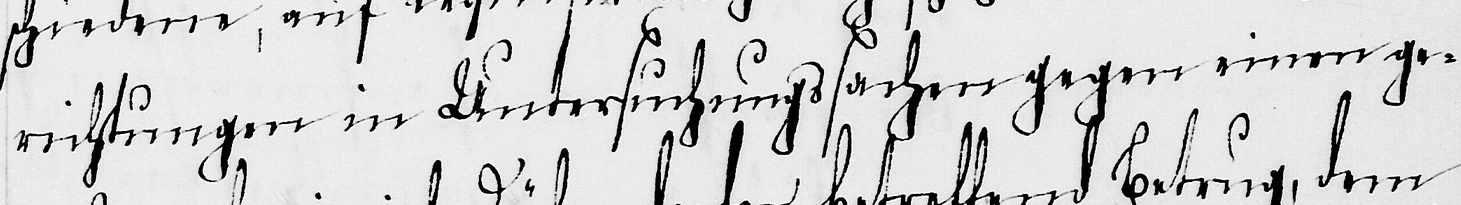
richtungen in Untersuchungssachen gegen einen ge¬
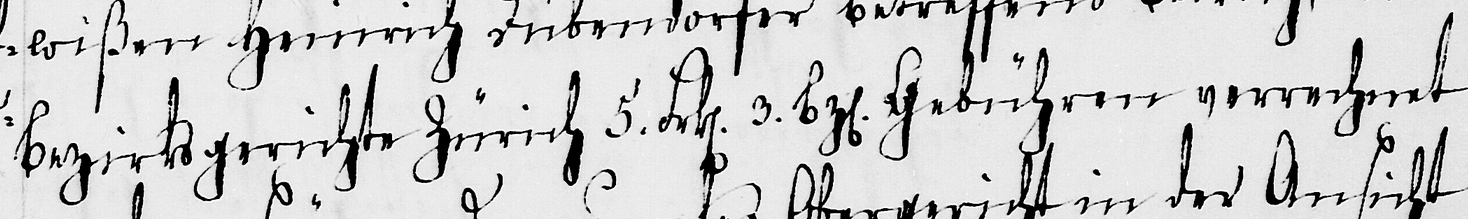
Bezirksgerichte Zürich 5. Frk. 3. Bz. Gebühren verrechnet
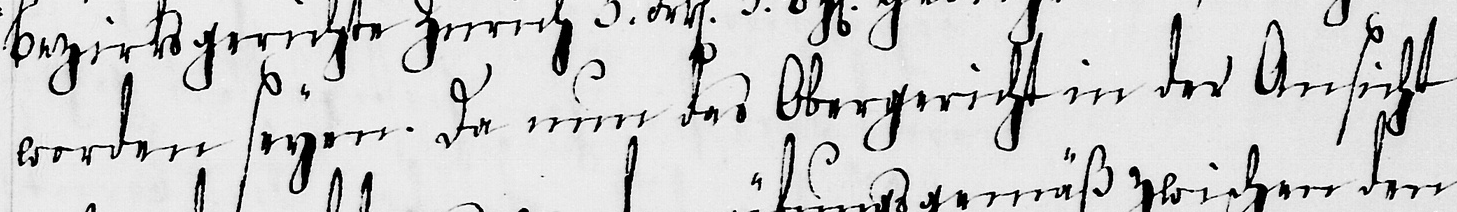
worden seyen. Da nun das Obergericht in der Ansicht
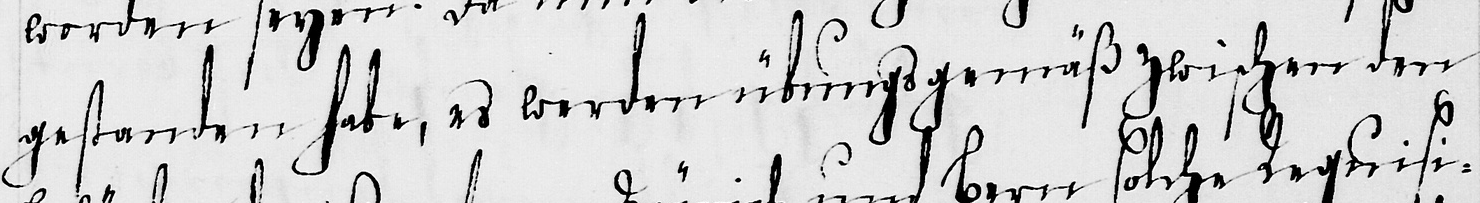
gestanden habe, es werden übungsgemäß zwischen den
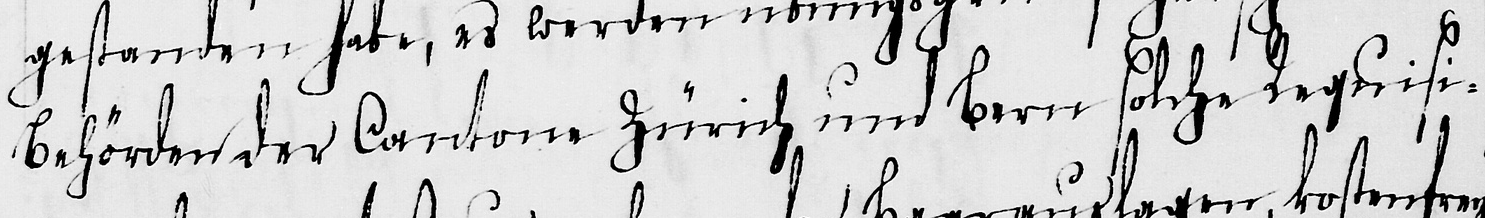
Behörden der Cantone Zürich und Bern solche Requisi¬
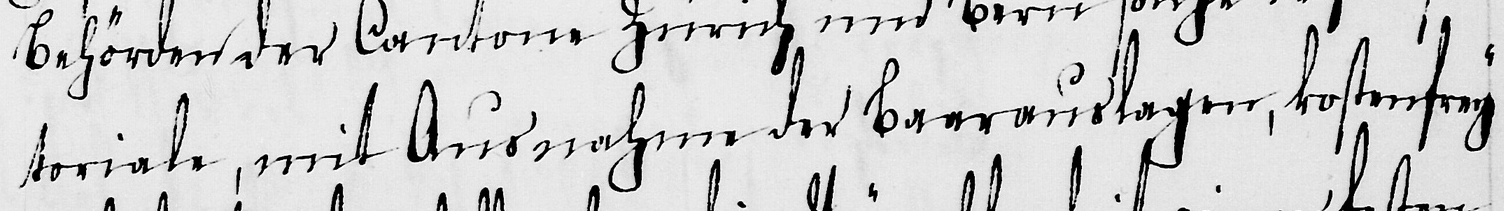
toriale, mit Ausnahme der Baarauslagen, kostenfrey
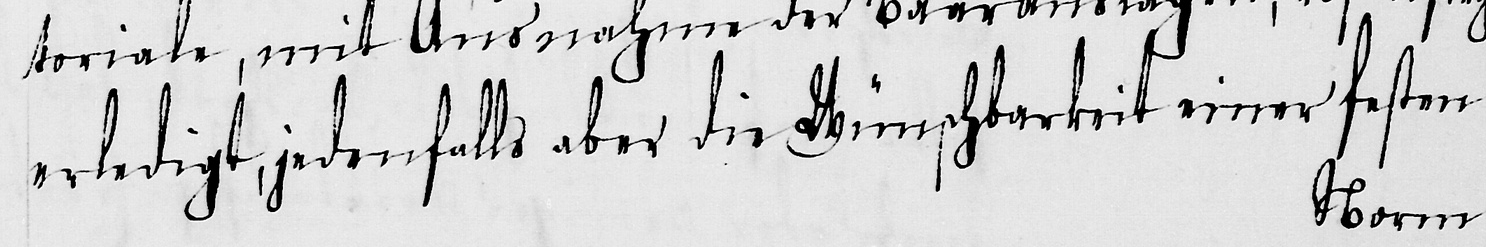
erledigt, jedenfalls aber die Wünschbarkeit einer festen
